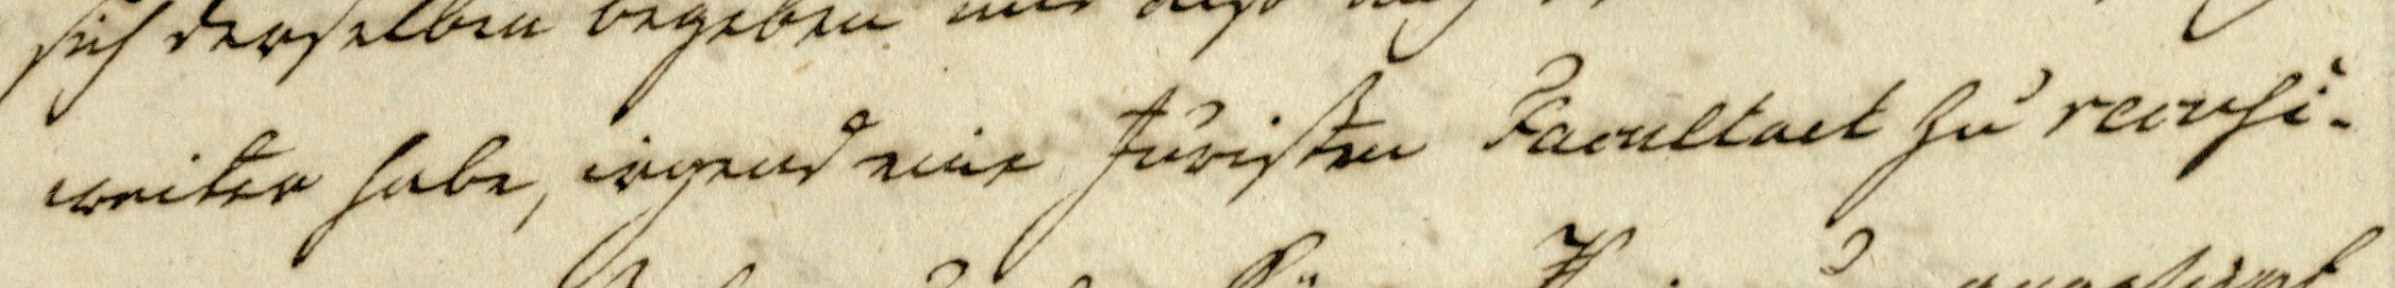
weiter habe, irgend eine Juristen Facultaet zu recusi¬
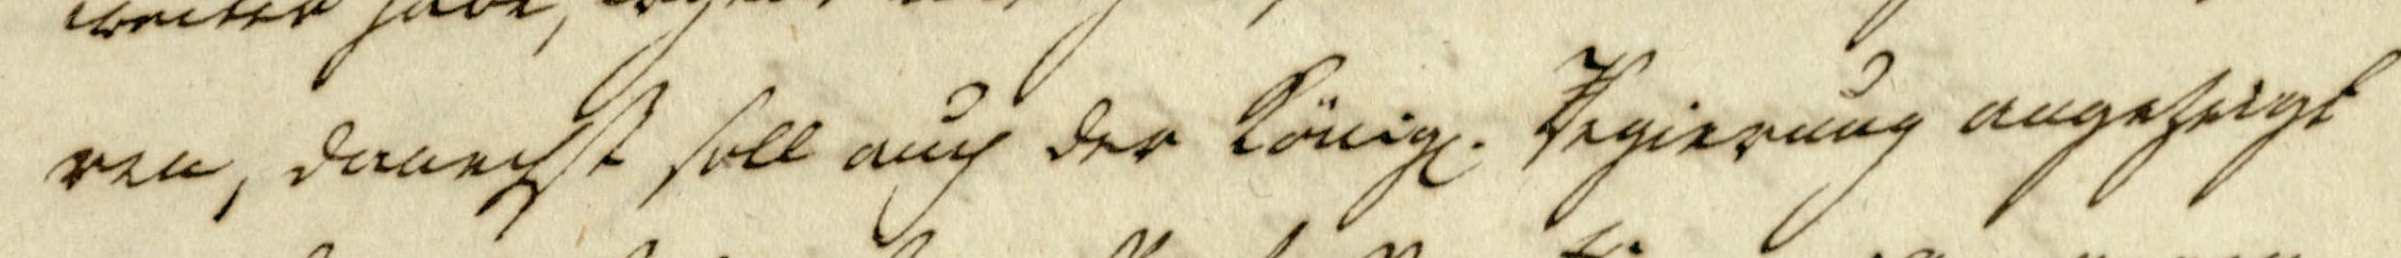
ren, danechst soll auch der Königl. Regierung angezeigt
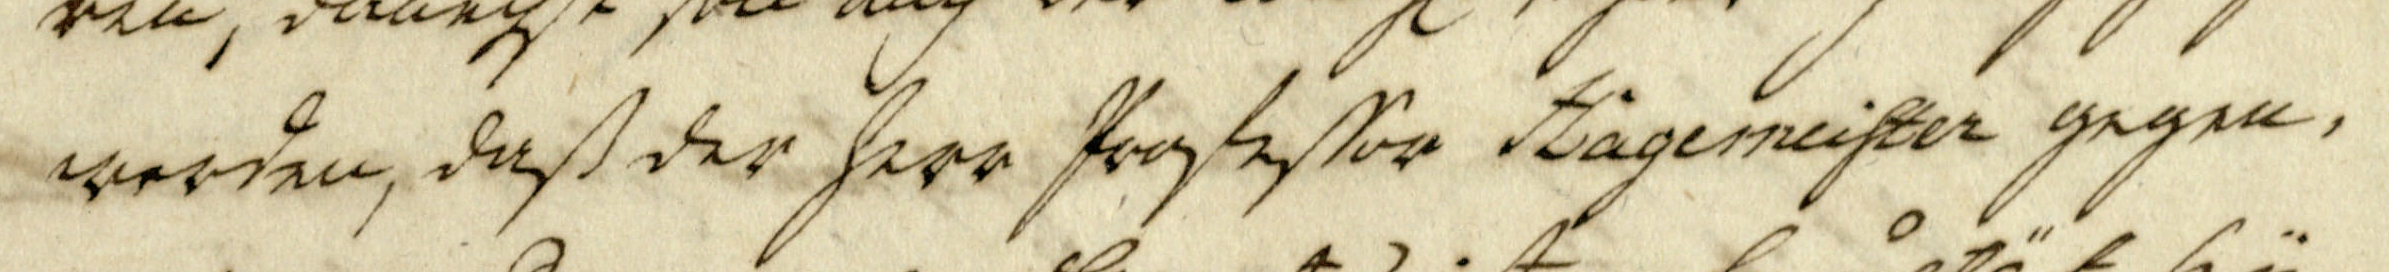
werden, daß der herr Professor Hagemeister gegen¬
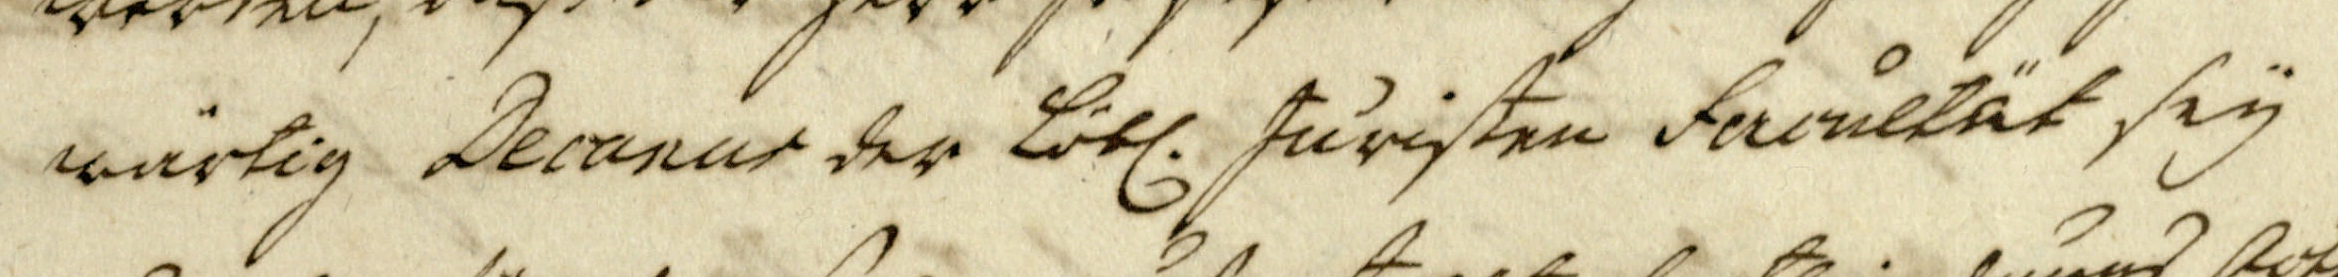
wärtig Decanus der Löbl. Juristen Facultät seÿ
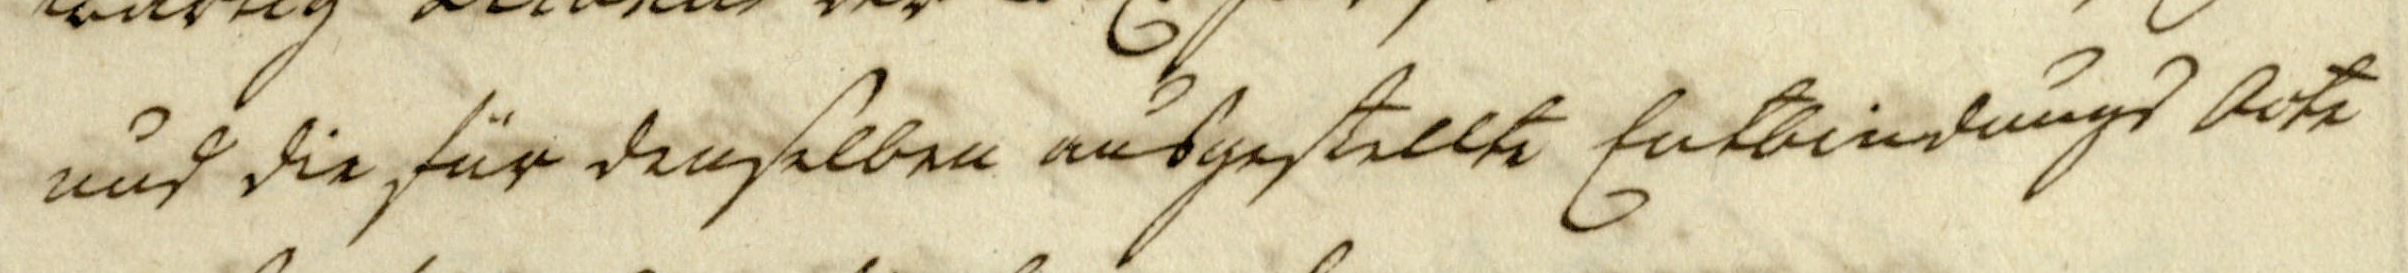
und die für denselben ausgestellte Entbindungs Acte
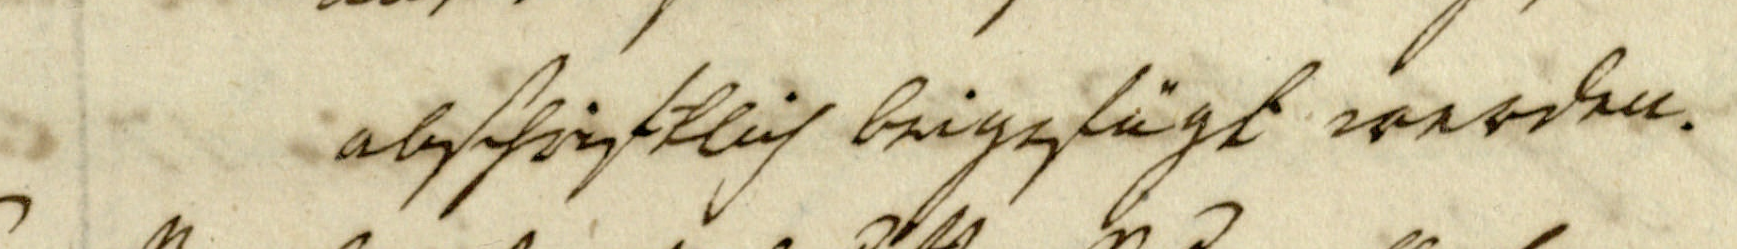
abschriftlich beigefügt werden.
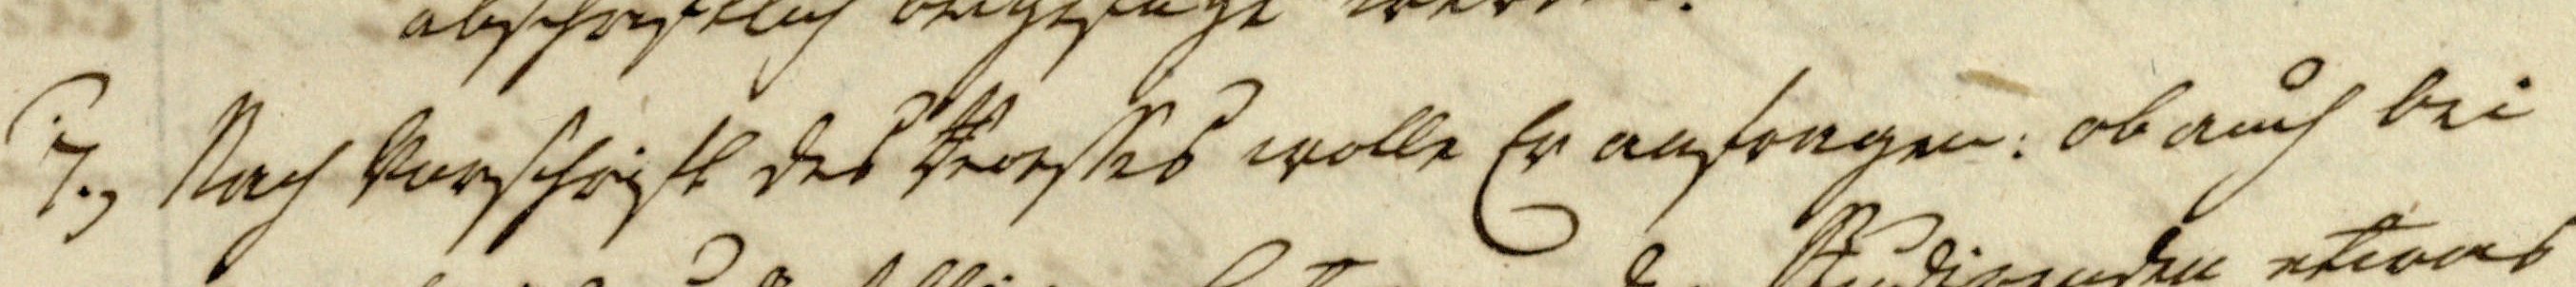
7., Nach Vorschrift des Recesses wolle Er anfragen, ob auch bei
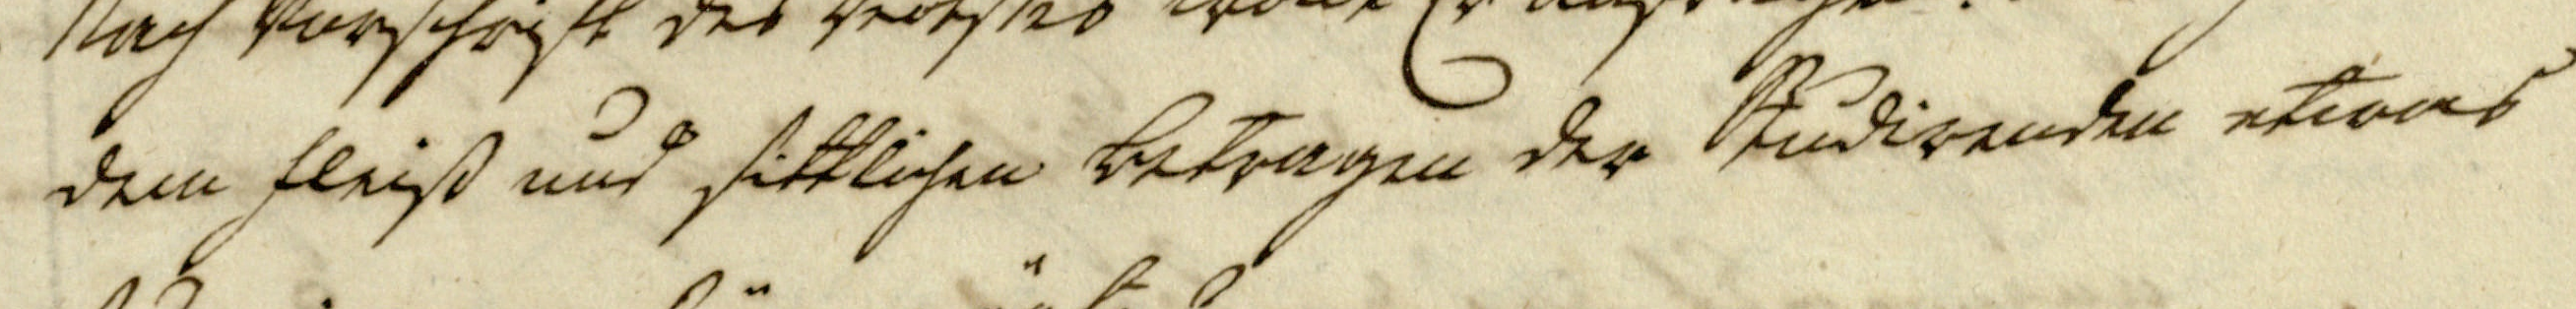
dem Fleiß und sittlichen Betragen der Studirenden etwas
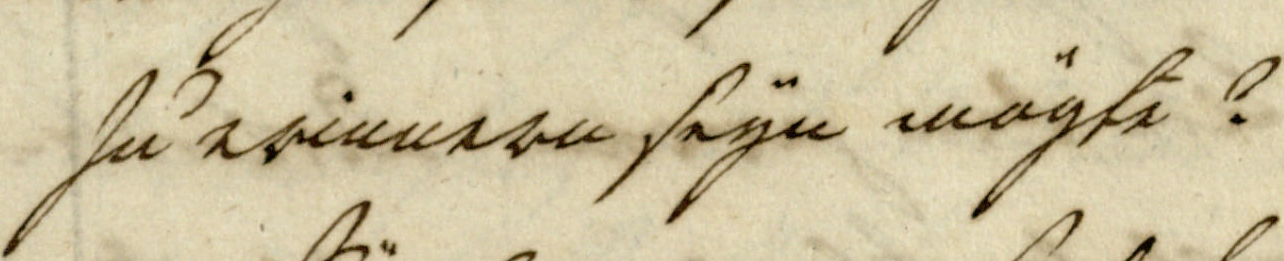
zu erinnern seÿn mögte!
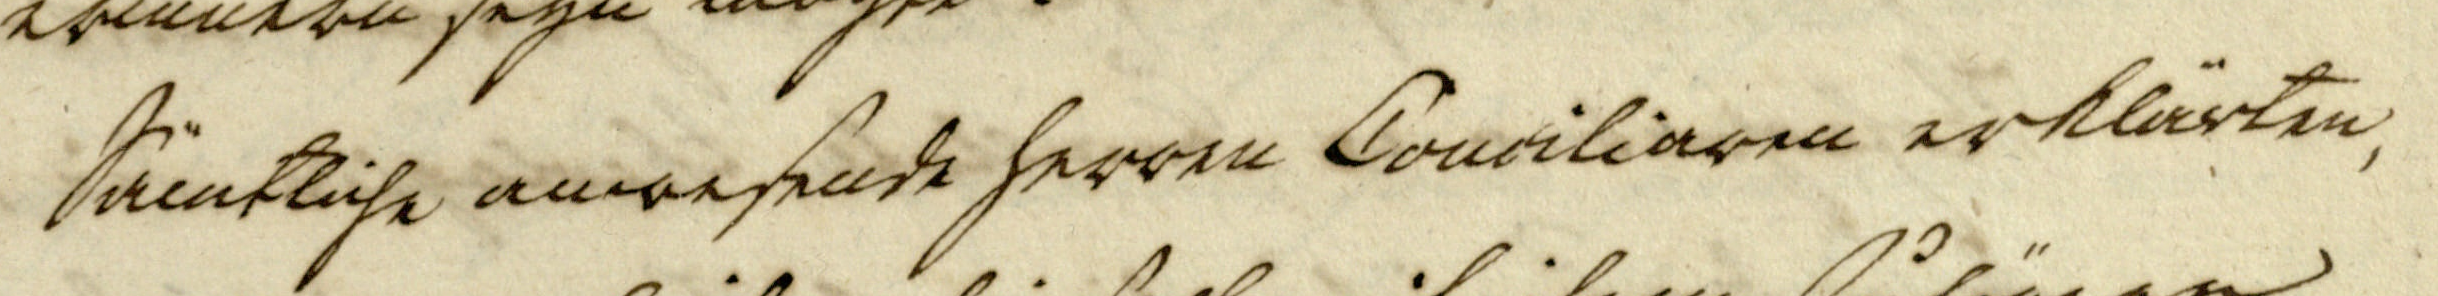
Sämtliche anwesende herren Conciliaren erklärten,
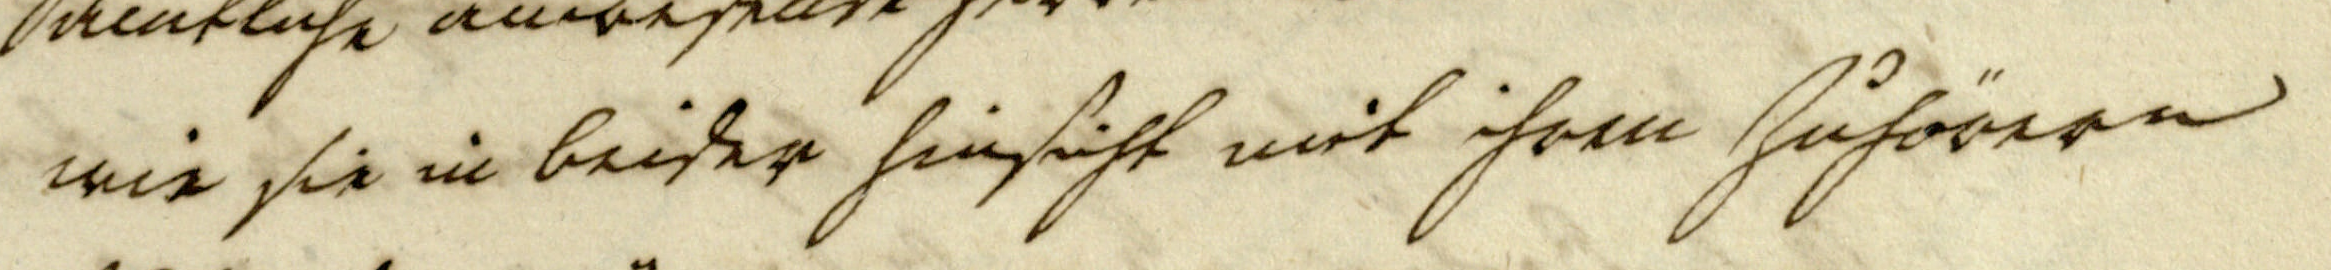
wie sie in beider hinsicht mit ihren Zuhörern
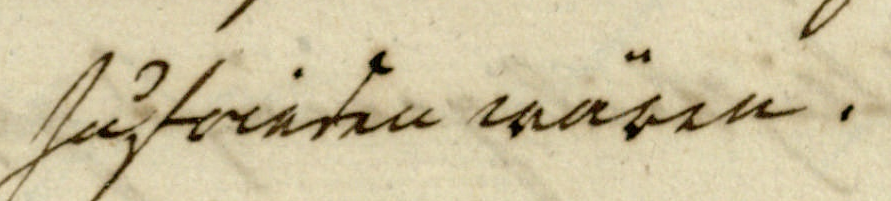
zufrieden wären.
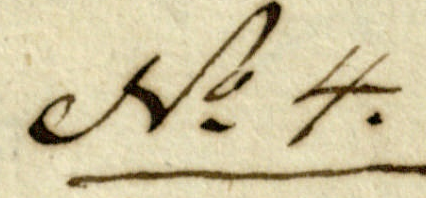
Nº 4.
